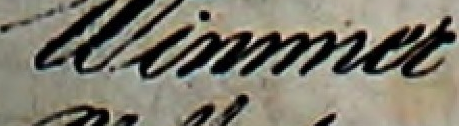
Wimmer
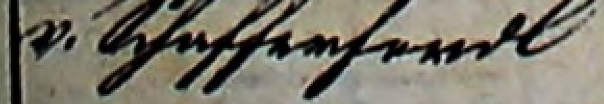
v. Schafferherdl
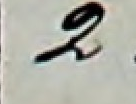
2
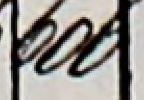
606
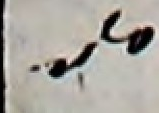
do
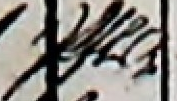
Pfls„
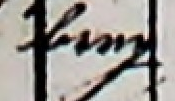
berg
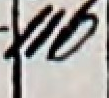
116
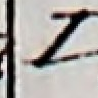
I
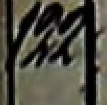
122
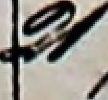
21
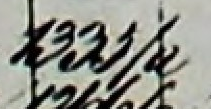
1335/a
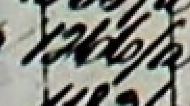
1266/a
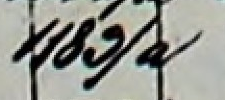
1183/a
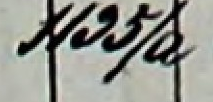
1135/a
